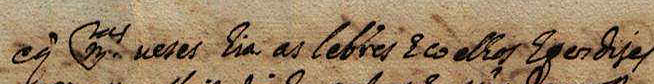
e q̄ mtas ueses hia as lebres E coelhos E per diser
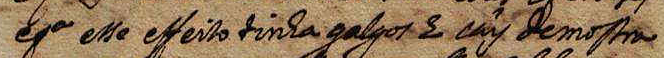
e pa esse effeito tinha galgos E caīs de mostra
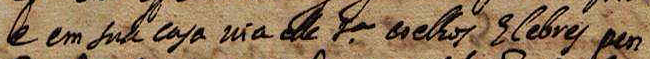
e em sua casa uia elle t.a coelhos, E lebres pen
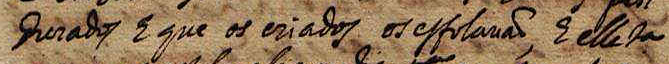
durados E que os criados os esfolauaõ, E elle ta
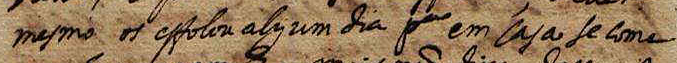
mesmo os esfolou algum dia pa em casa se come
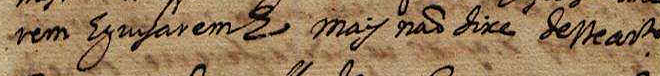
rem E guisarem E mais naõ dixe deste arto.
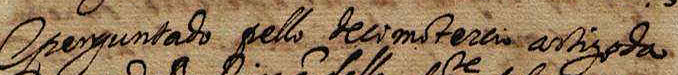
E perguntado pello de como tercio artigo da
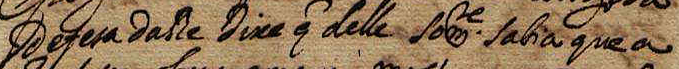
Defesa da Re dixe q̄ delle som.te sabia que a
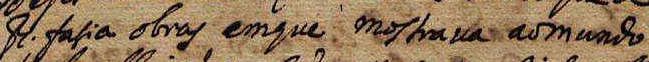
R. fasia obras em que mostraua ao mundo
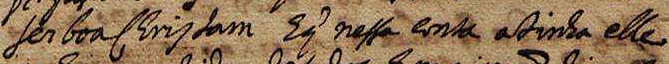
ser boa Christam, E q̄ nessa conta a tinha elle
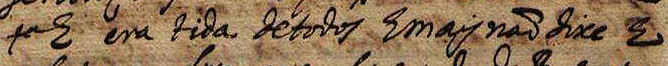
ta E era tida de todos E mais naõ dixe E
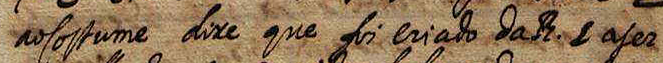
ao Costume dixe que foi criado da R. E a ser
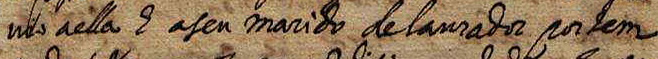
uio a ella E a seu marido de laurador por tem
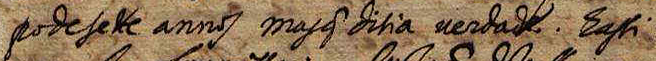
po de sette annos mas q̄ disia uerdade. E assi
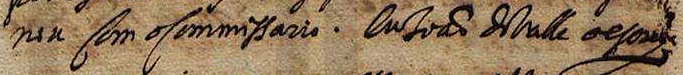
nou Com o Commissario. Eu Ioão do Valle o escreuy
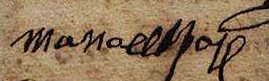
manoel lpes
